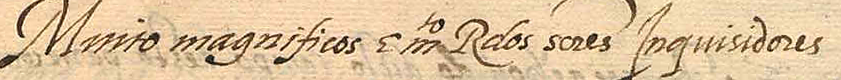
Muito magnificos E mto Rdos s̅ores Jnquisidores
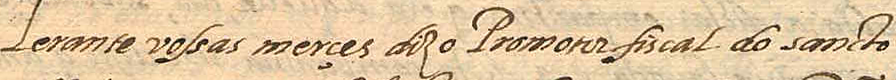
Perante vossas merçes diz o Promotor fiscal do sancto
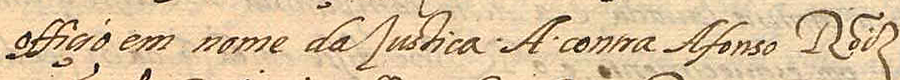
offiçio em nome da Justica .A. contra Afonso Ro̅iz
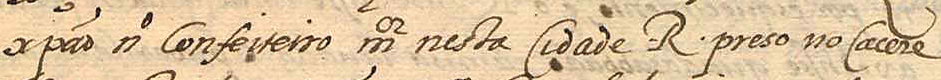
xpão no Confeiteiro mor nesta Cidade .R. preso Cacere
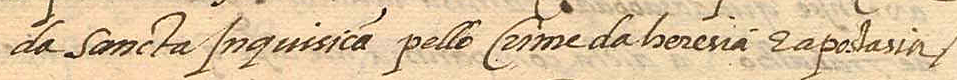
da Sancta Jnquisica̅ pello Crime da heresia E apostasia /
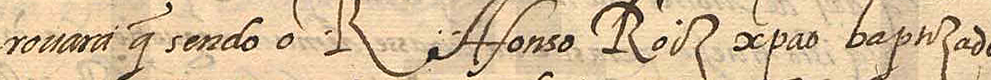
rouara q̅ sendo o .R. Afonso Ro̅iz xpão baptizado
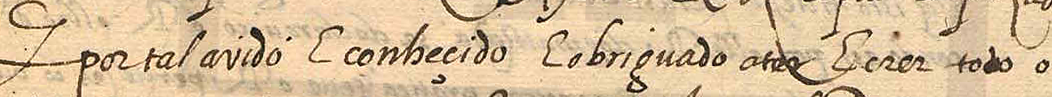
E por tal avido E conheçido E obriguado a ter E crer todo o
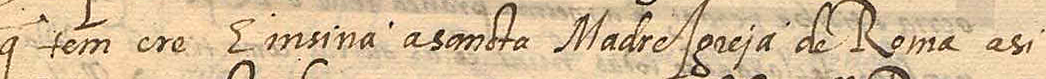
q̄ tem cre E insina a sancta Madre Jgreja de Roma asi
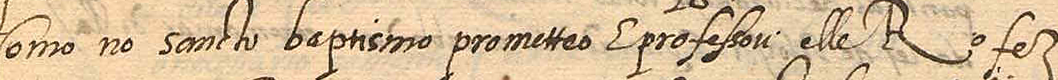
Como no sancto baptismo prometteo E professou elle R o fez
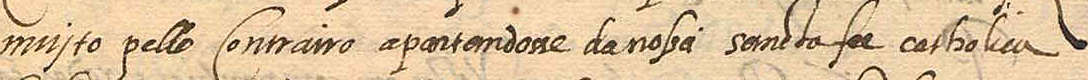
mujto pello Contrairo apartandosse da nossa sancta fee catholica
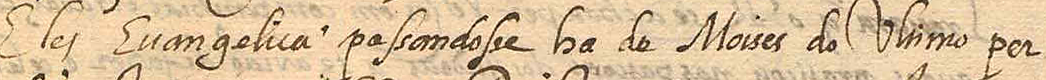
E lej Euangelica passandosse ha de Moises do Vltimo per
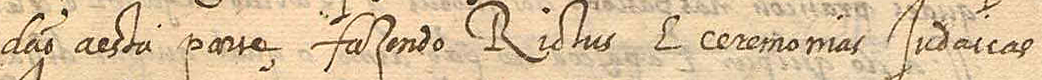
daõ a esta parte, fazendo Rictus E ceremonias Judaicas
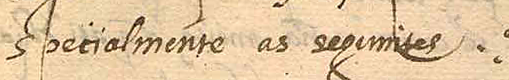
specialmente as seguintes:
